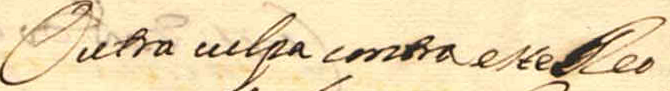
Outra culpa contra este Reo
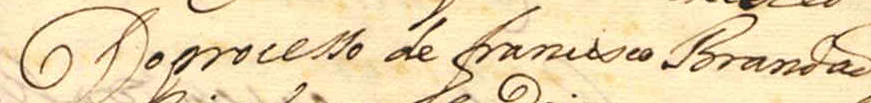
Do processo de francisco Brandão
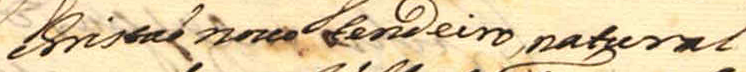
christaõ nouo tendeiro, natural
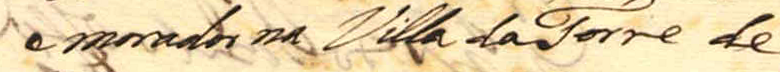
e morador na Villa da Torre de
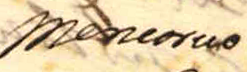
mencoruo
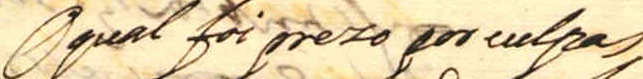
O qual foi prezo por culpas
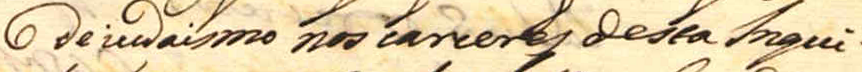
de iudaismo nos carceres desta Inqui
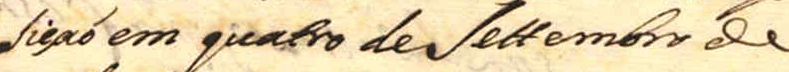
sição em quatro de Settembro de
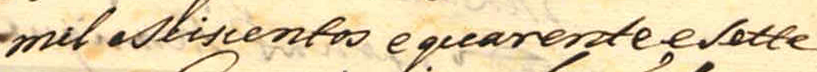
mil e seiscentos e quarente e sette
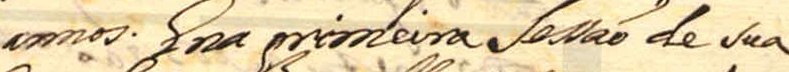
annos. E na primeira Sessão de sua
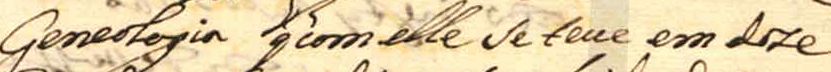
Geneologia q̅ com elle se teue em doze
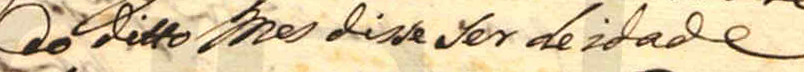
do ditto mes disse ser de idade
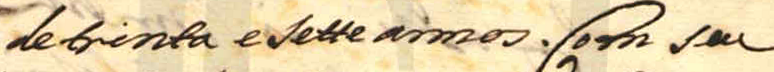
de trinta e sette annos. Com seu
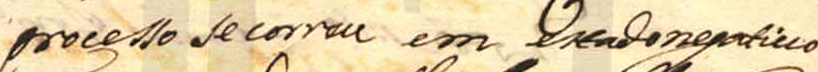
processo se correu em estado negatiuo.
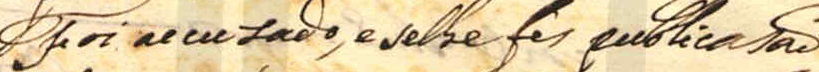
Foi accuzado, e se lhe fes publicasão
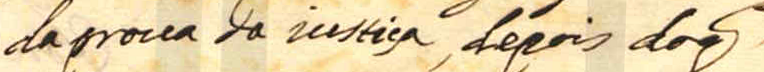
da proua da iustiça, depois do q̅
